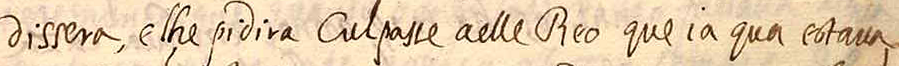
dissera, e lhe pidira Culpasse a elle Reo que ia que estaua
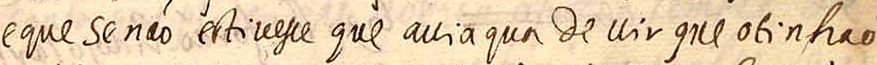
e que se naõ estiuesse que auia qua de uir que o tinhaõ
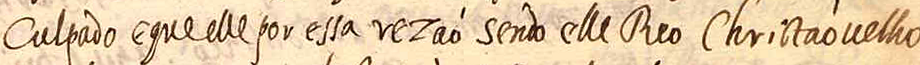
Culpado e que elle por essa rezaõ sendo elle Reo Christaõ uelho
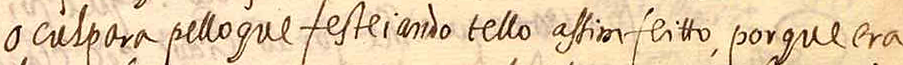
o culpara pello que festeiando tello assim feitto, porque era
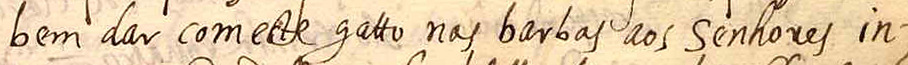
bem dar com este gatto nas barbas aos Senhores in
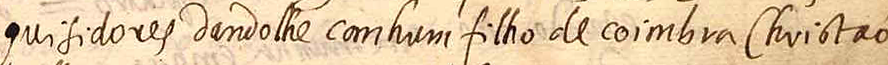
quisidores dandolhe com hum filho de coimbra Christaõ
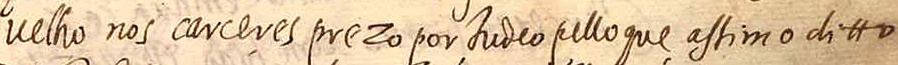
uelho nos carceres prezo por Iudeo pello que assim o ditto
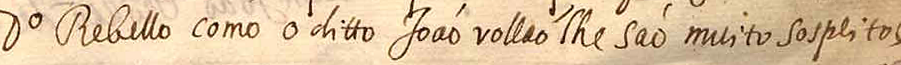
Do Rebello como o ditto Joaõ rollaõ lhe saõ muito sospeitos
